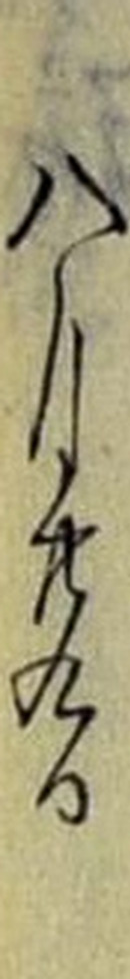八月廿九日
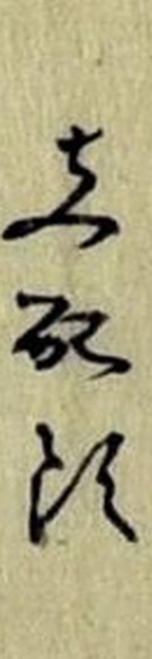支配頭
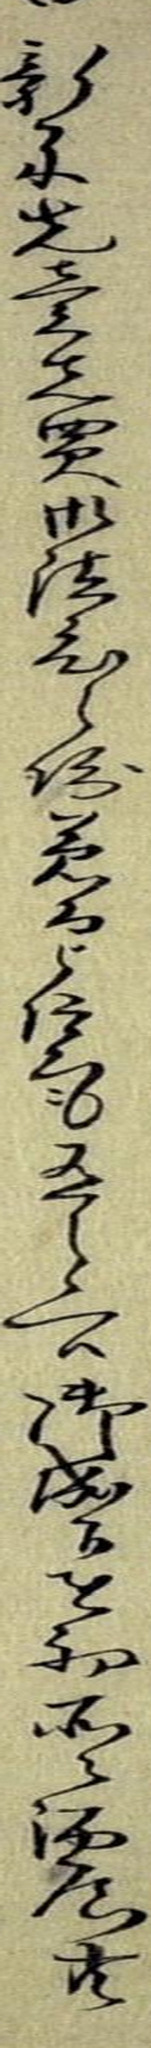○新米先売先買御法度之儀兼而被仰出も有之候へハ御城下を初所々酒屋共
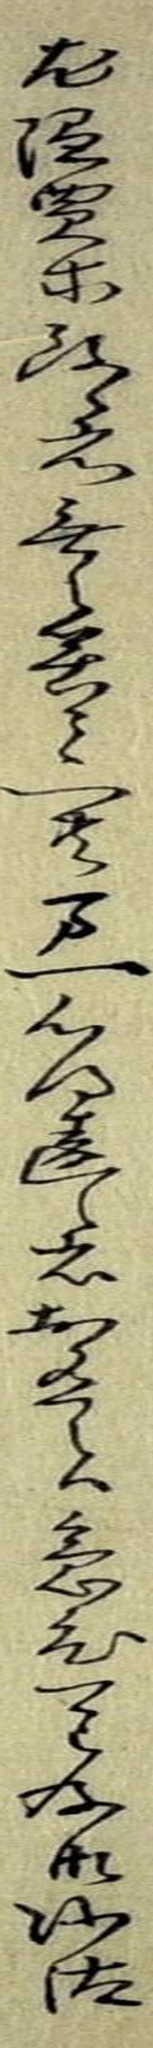尤隠買等致候者無之筈ニ候へ共万一心得違之者於有之ハ急度可被及御沙汰
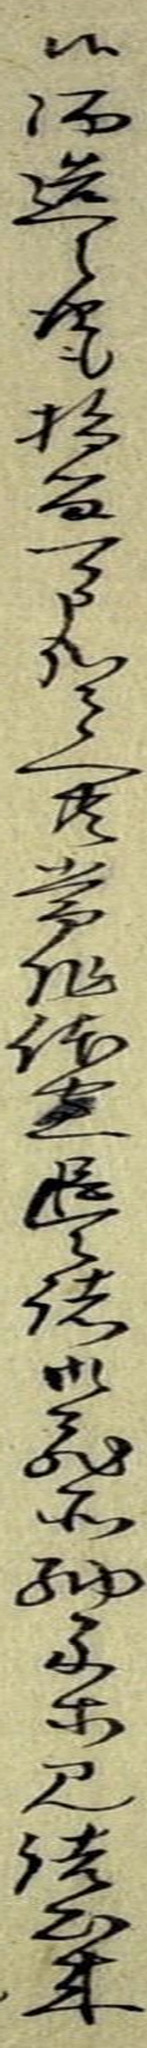候酒造之儀も指留可申哉ニ候へ共常作体宜追々諸御蔵所納米等見詰出来
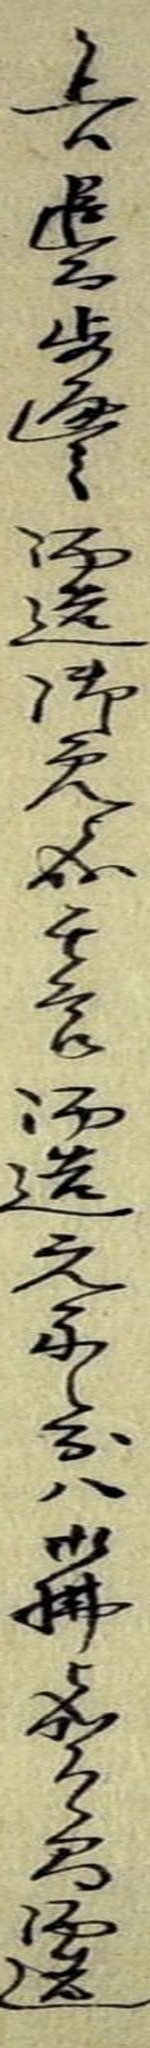候上ハ追而歩通之酒造御免ニ成其節酒造元米之分ハ御払被成下候間酒造
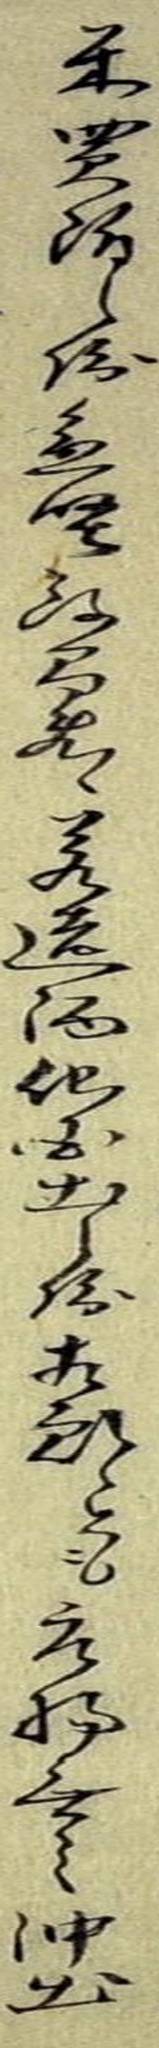米買附之儀愈堅致間敷候若造酒他国出之儀相願候とも取扱無之沖出
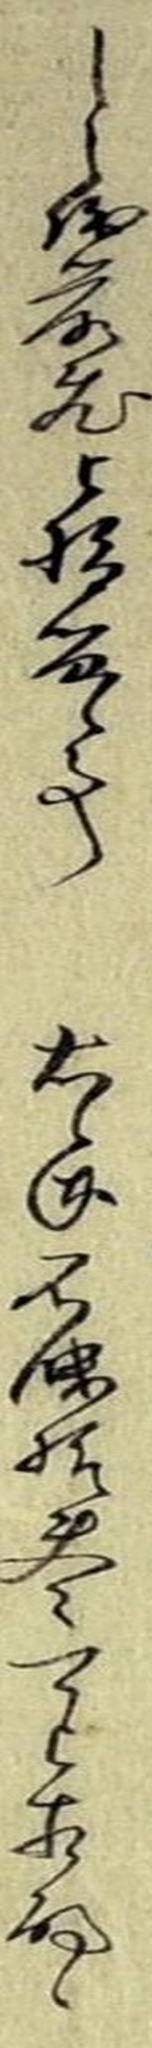し之儀厳敷被指留候事右之趣不洩様夫々可被相触候
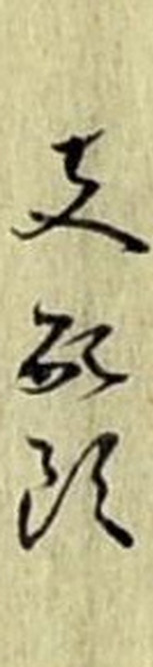支配頭
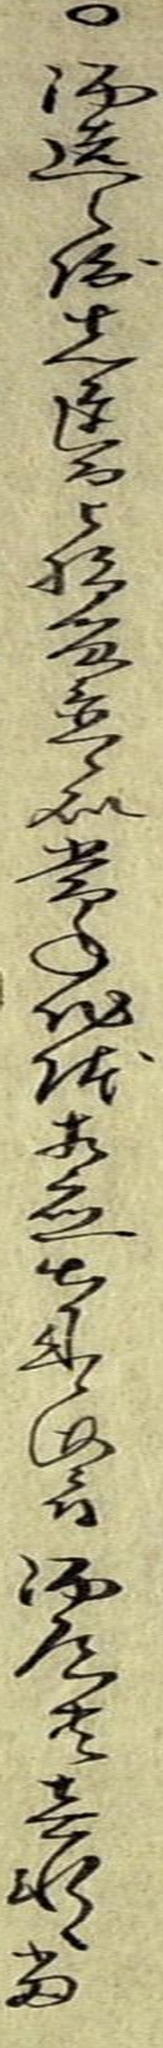○酒造之義先達而被指留置候処常年作体相応出来候義ニ付酒屋共壱軒へ当
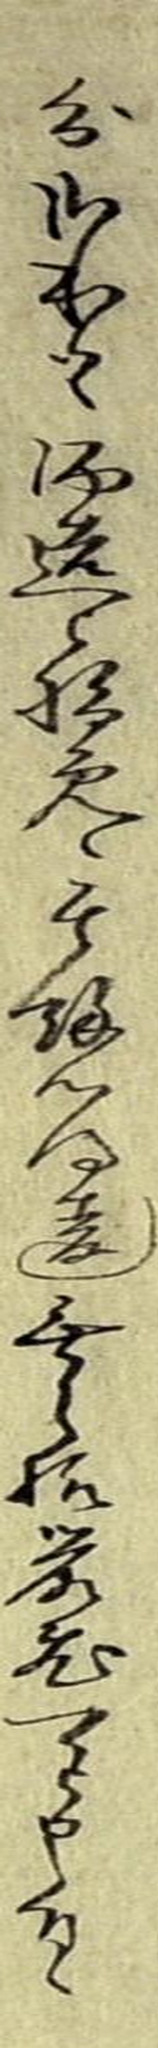分弐本ツヽ酒造被指免候其余心得違無之様厳敷可被申付候
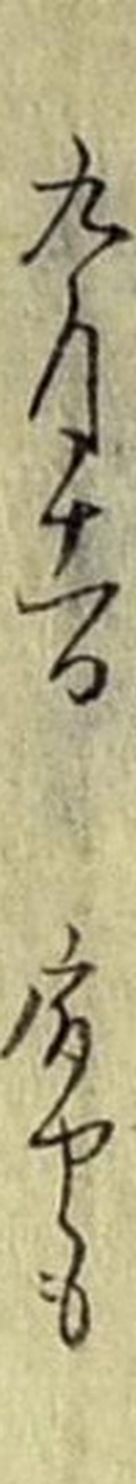九月十一日府中へも
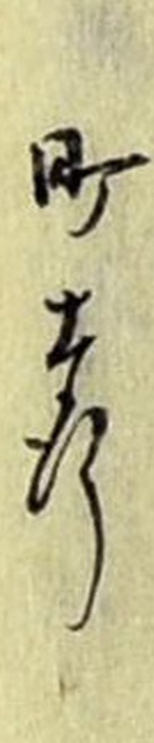町奉行
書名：命令之部 五
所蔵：福井県文書館 Fukui Prefectural Archives
